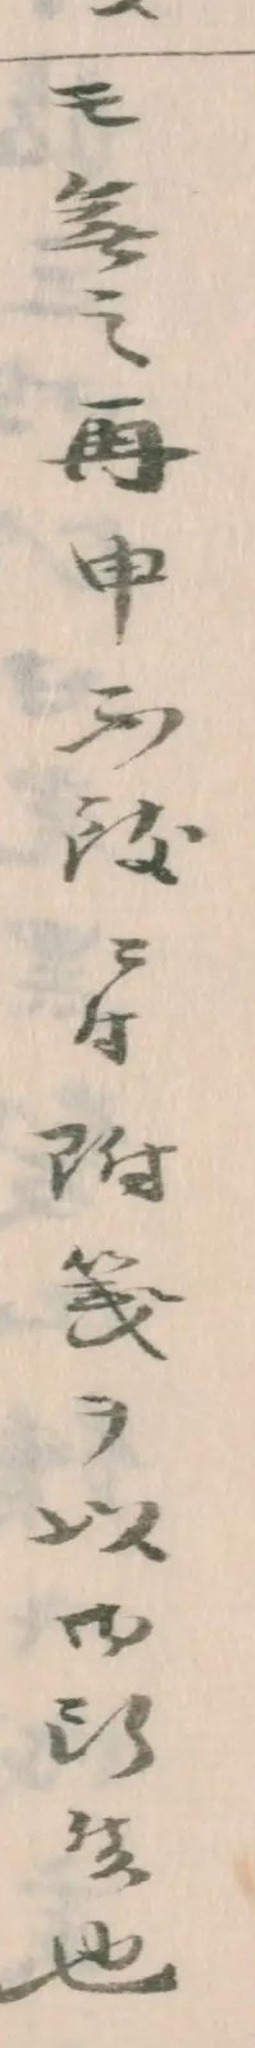モ無之再申不致ニ付附箋ヲ以御断候也
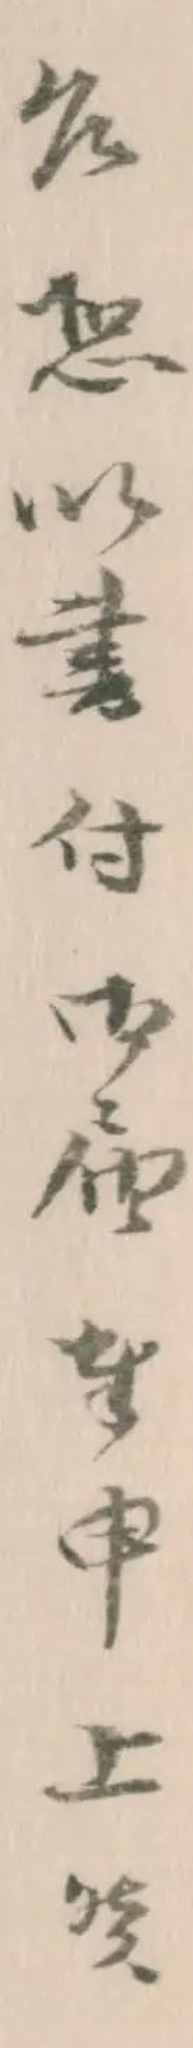乍恐以書付御届奉申上候
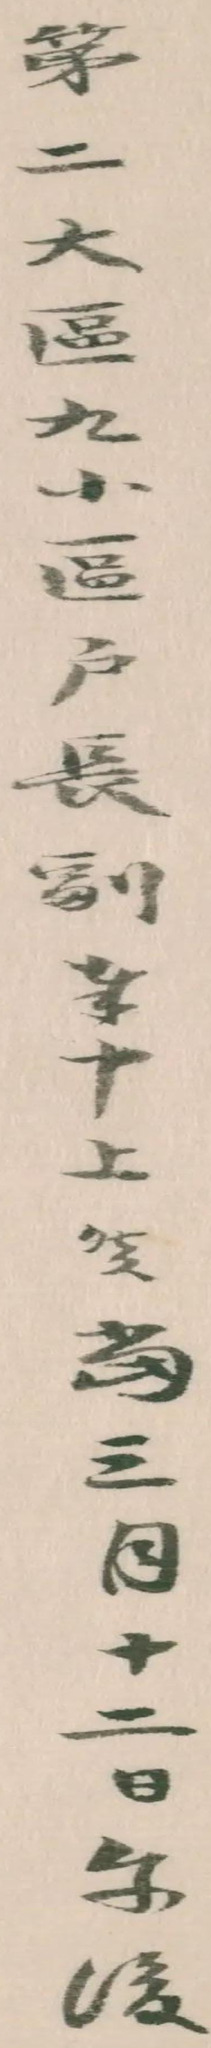第二大区九小区戸長副奉申上候当三月十二日午後
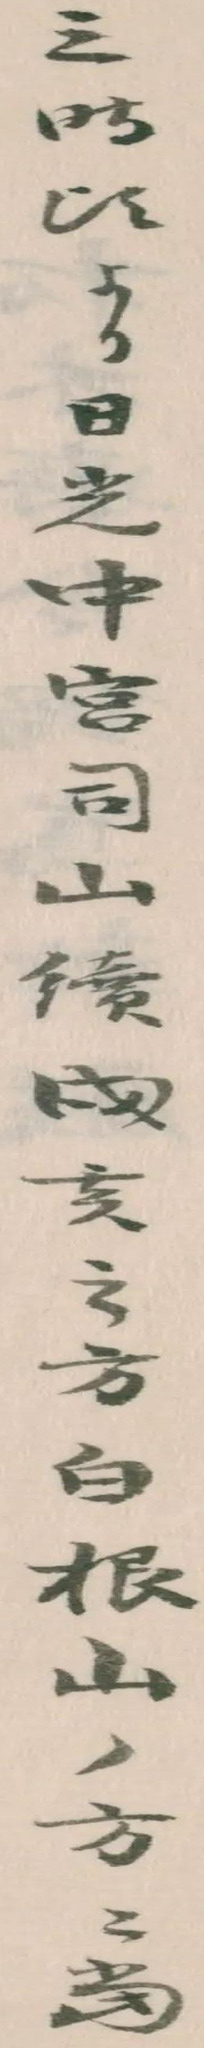三時頃より日光中宮司山続戌亥之方白根山ノ方ニ当
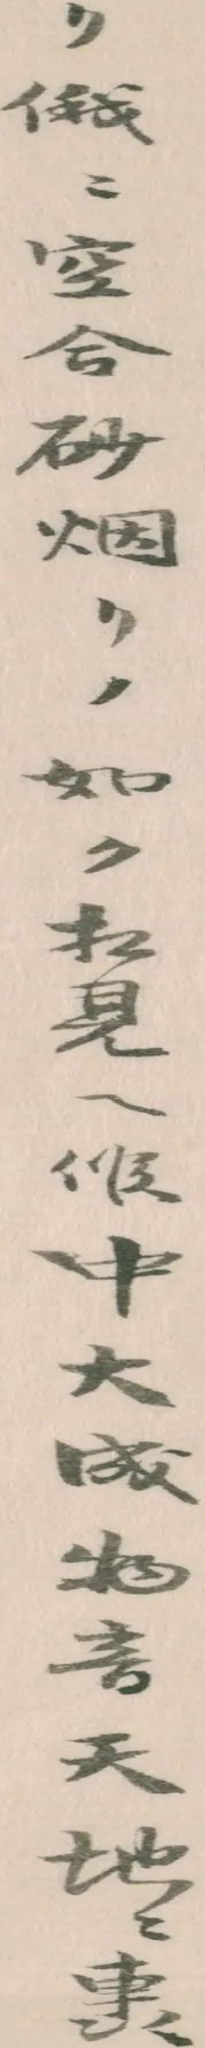リ俄ニ空合砂烟リノ如ク相見へ候中大成物音天地ニ轟
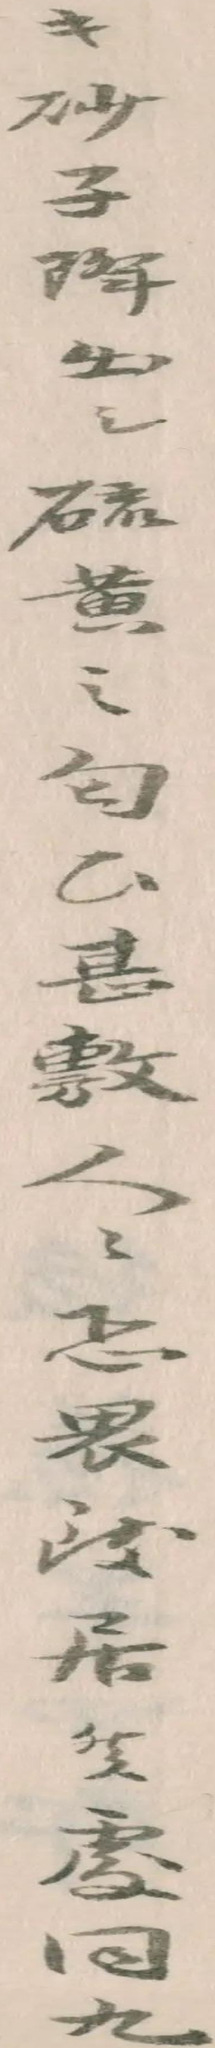キ砂子降出シ硫黄之匂ひ甚敷人々恐畏致居候処同九
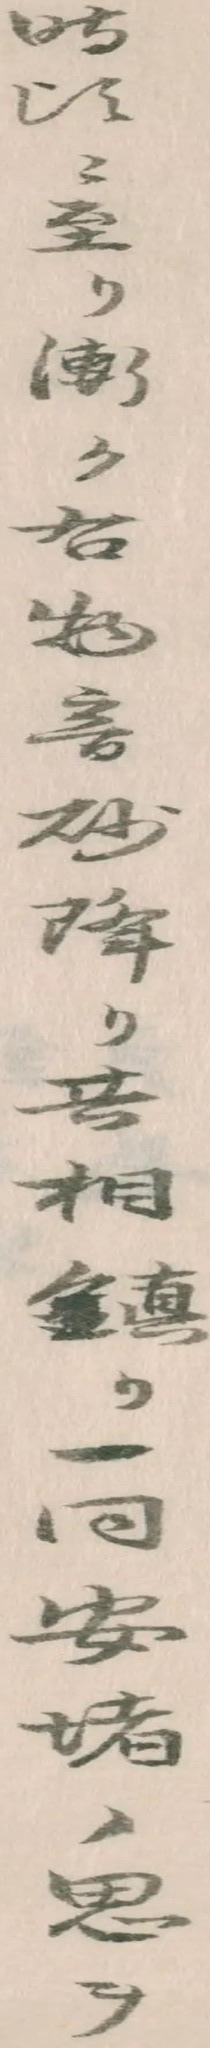時頃ニ至リ漸ク右物音砂降リ共相鎮リ一同安堵ノ思ヲ
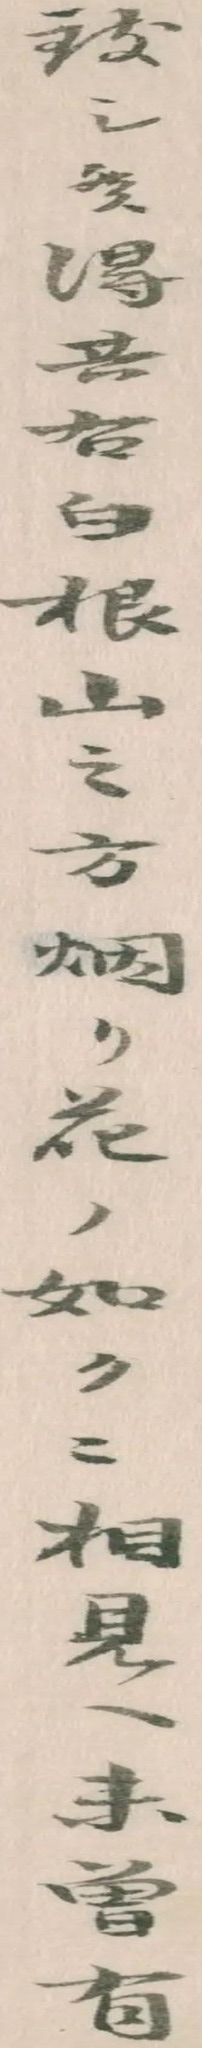致シ候得共右白根山之方烟リ花ノ如クニ相見へ未曾有
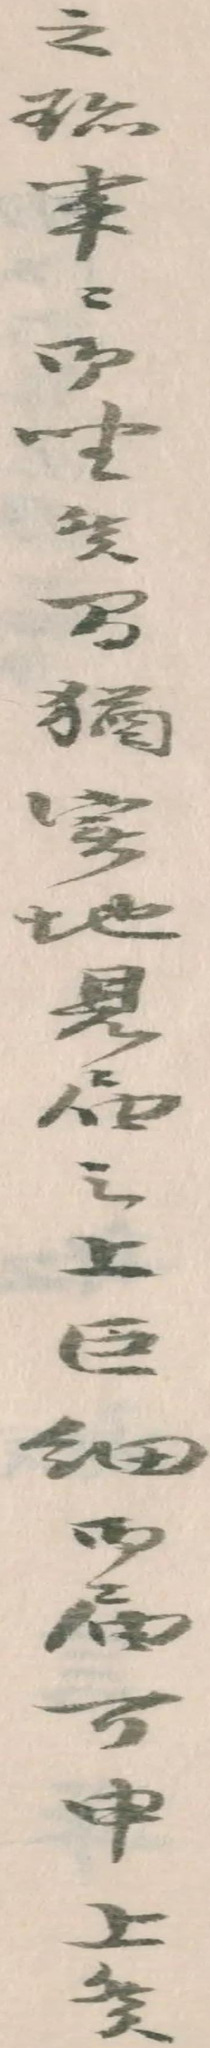之珍事ニ御坐候間猶実地見届之上巨細御届万申上候
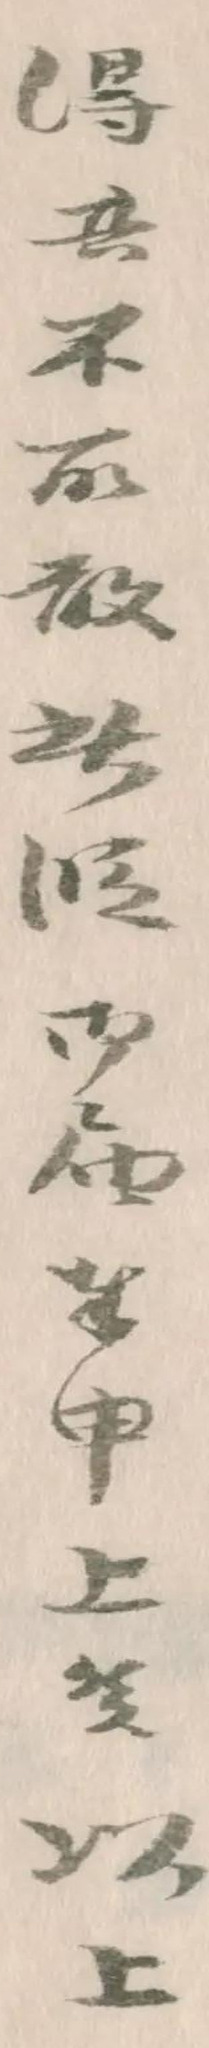得共不取敢此段御届奉申上候以上
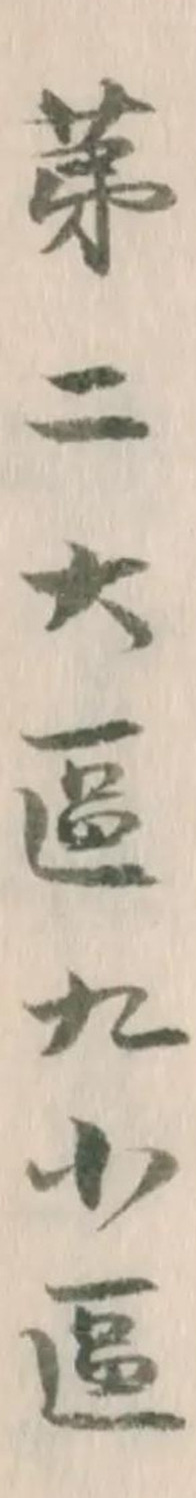第二大区九小区

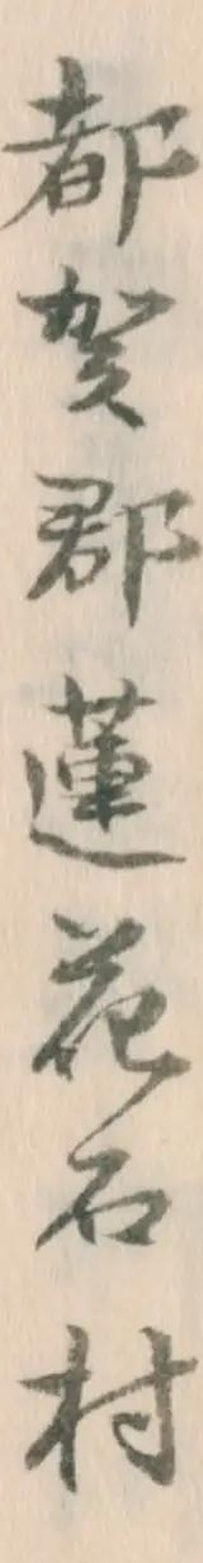都賀郡蓮花石村
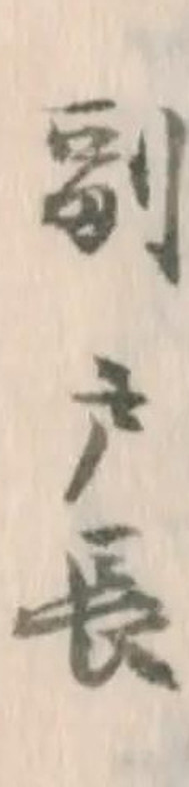副戸長
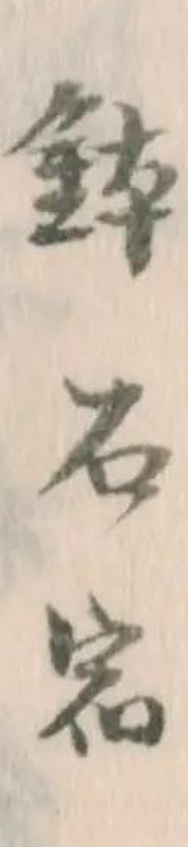鉢石宿
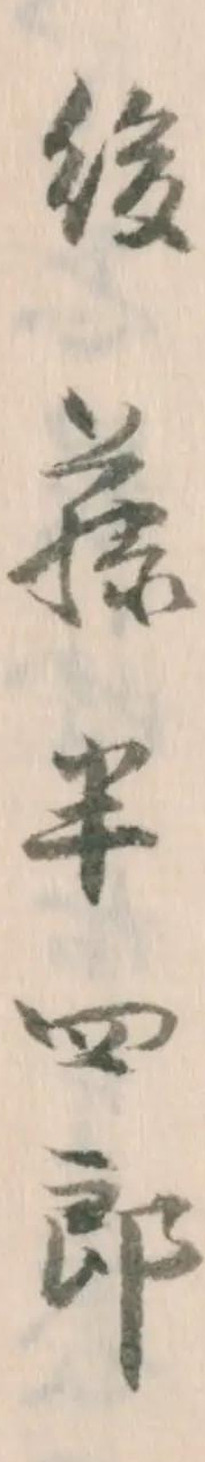後藤半四郎
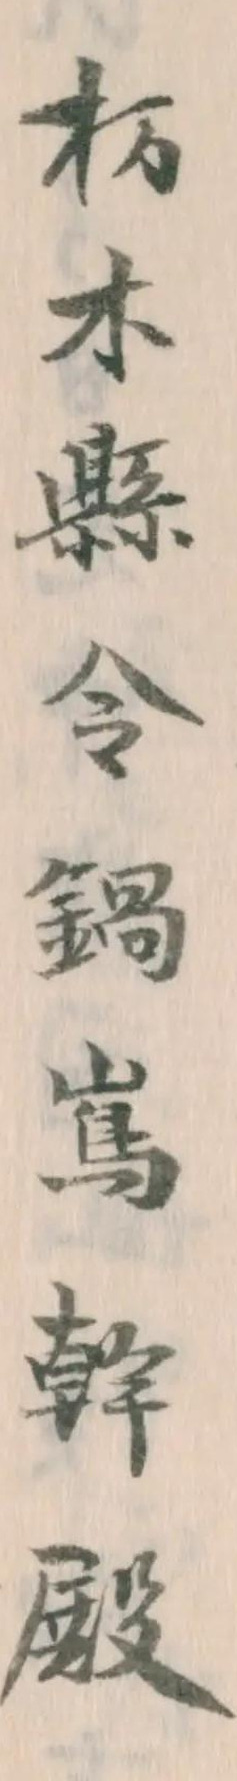栃木県令鍋島幹殿
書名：地災撮要. 巻11-12(地震之部)
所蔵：国立国会図書館 National Diet Library, JAPAN
